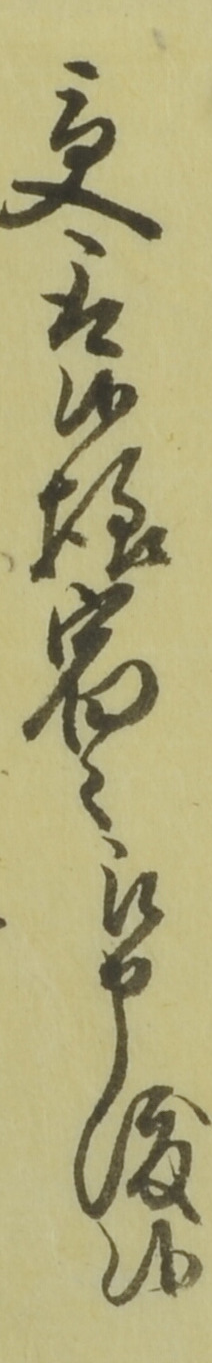受取候様宿々江申渡候
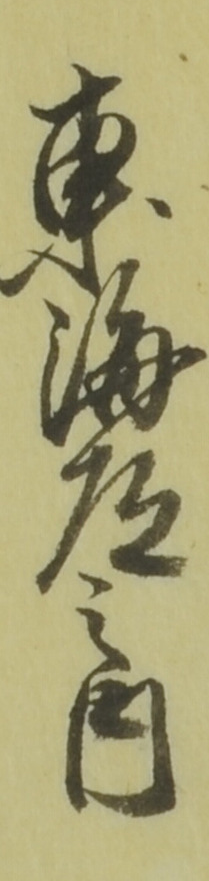東海道之内
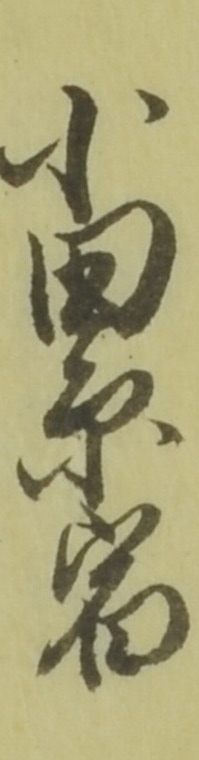小田原宿
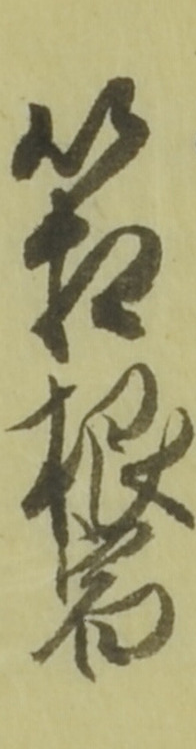箱根宿
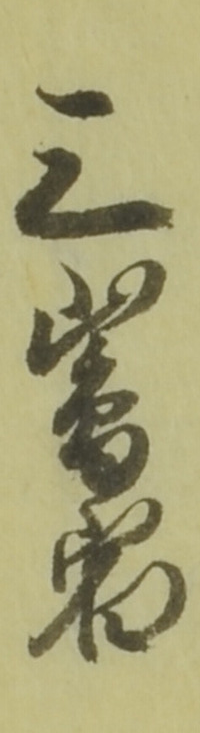三嶋宿
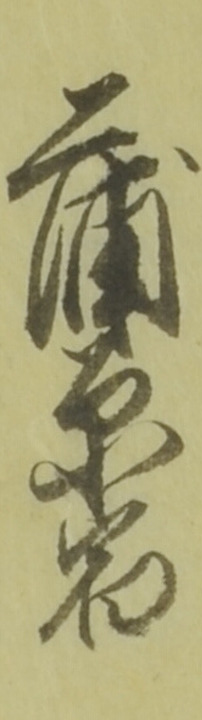蒲原宿
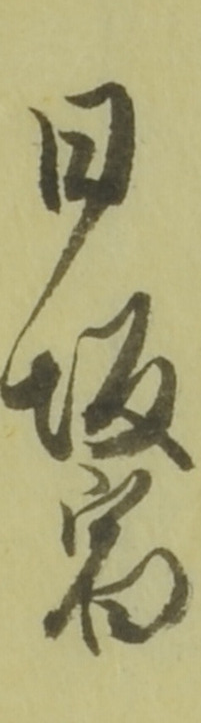日坂宿
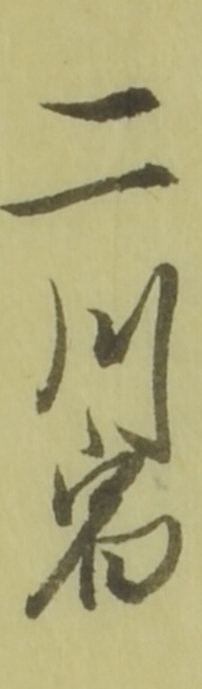二川宿
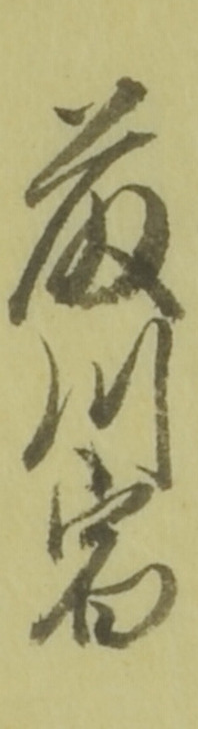藤川宿
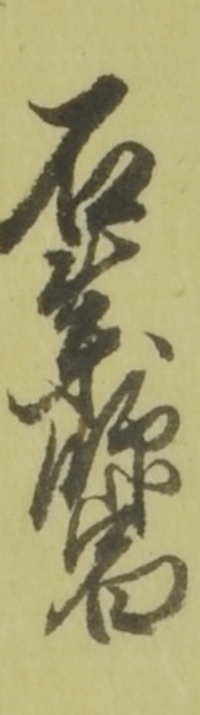石薬師宿
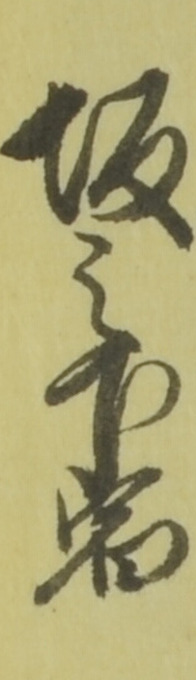坂之下宿
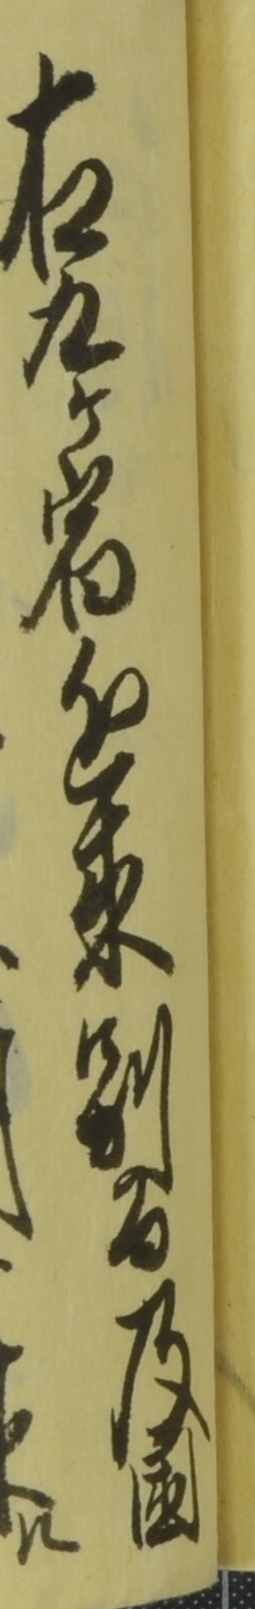右九ヶ宿近来別而及困
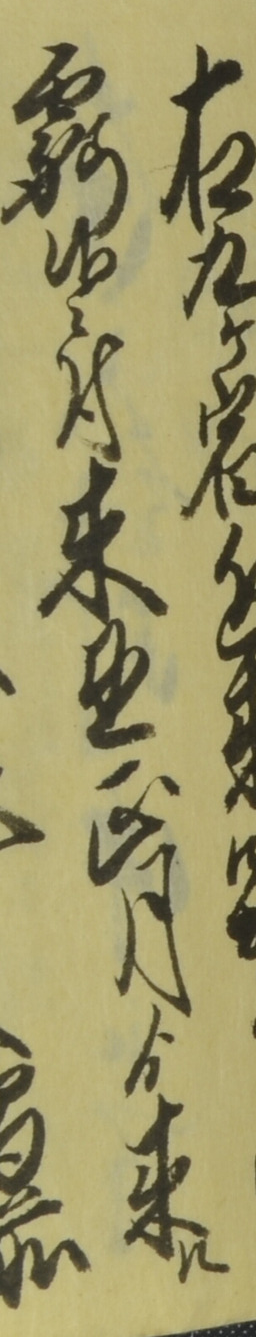窮候ニ付来丑正月ゟ来ル
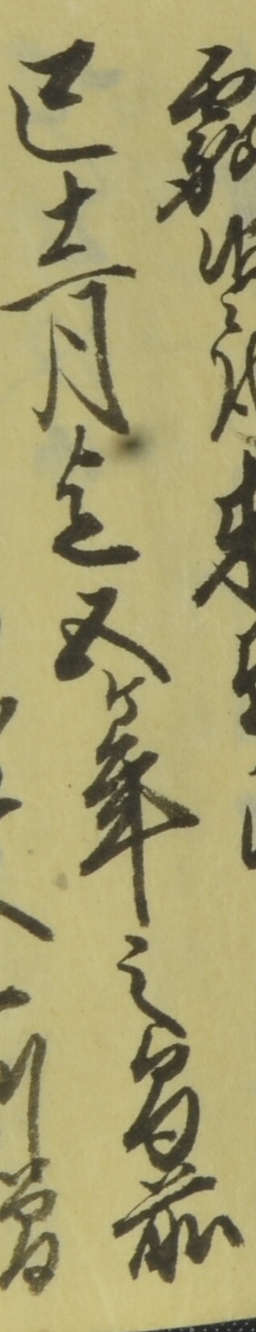巳十二月迄五ヶ年之間前

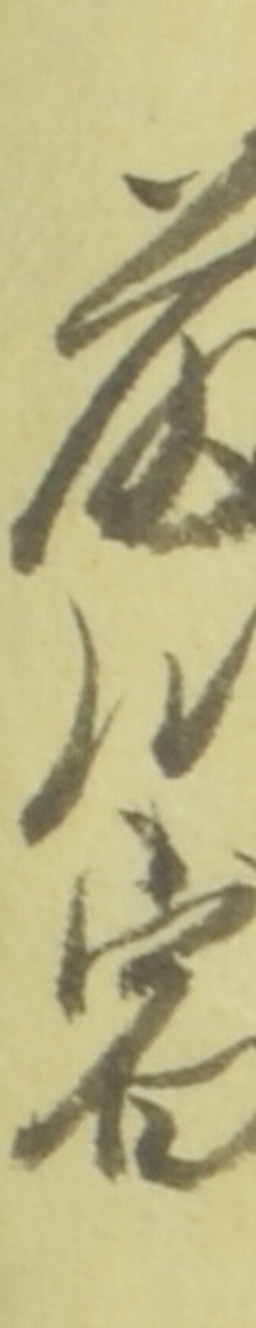藤川宿
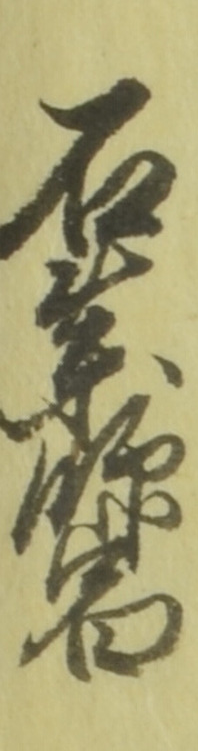石薬師宿
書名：御触書御書附控
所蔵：伊那市立高遠町図書館・合同会社AMANE
